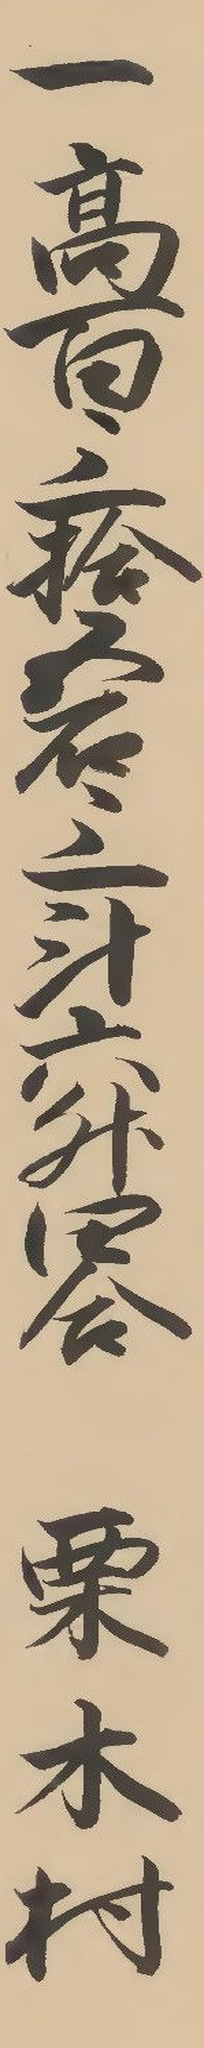一高百三拾五石三斗六升四合栗木村
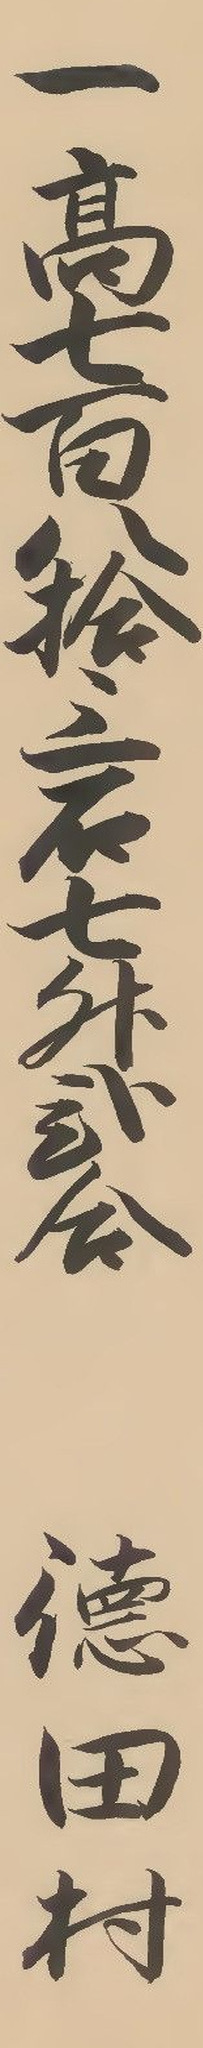一高七百八拾三石七升弐合徳田村
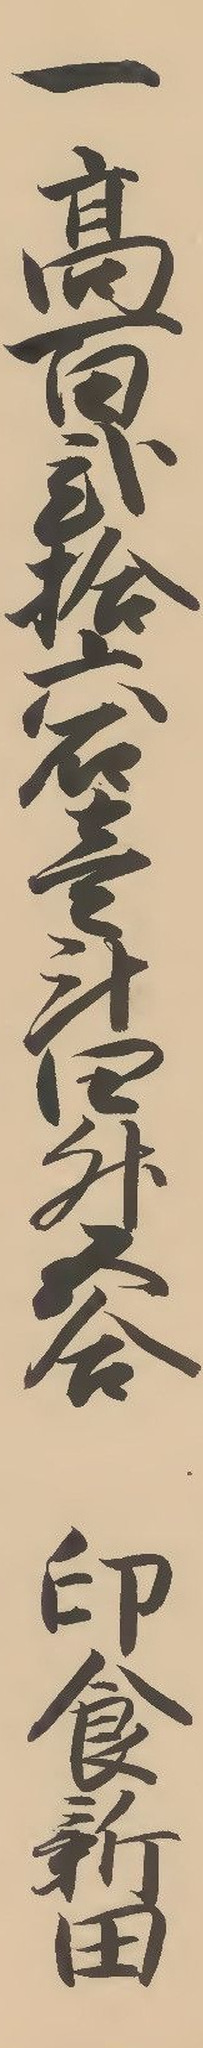一高百弐拾六石壱斗四升五合印食新田
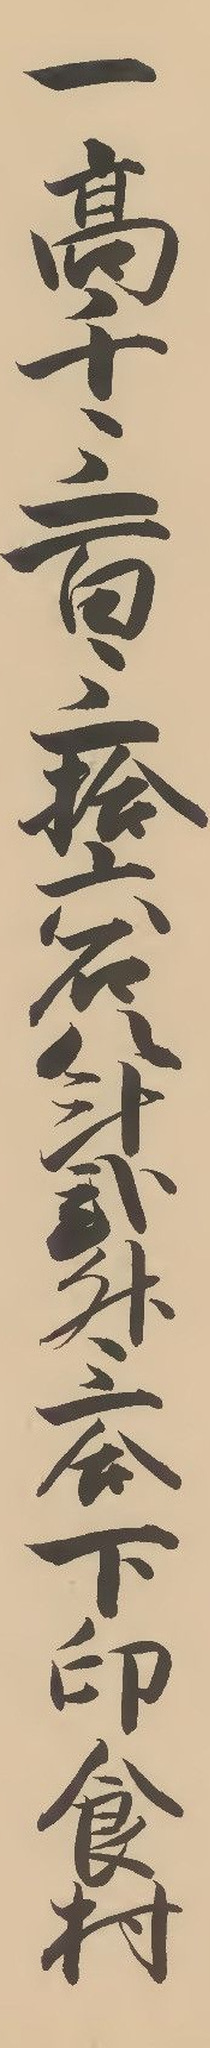一高千三百三拾六石八斗弐升三合下印食村
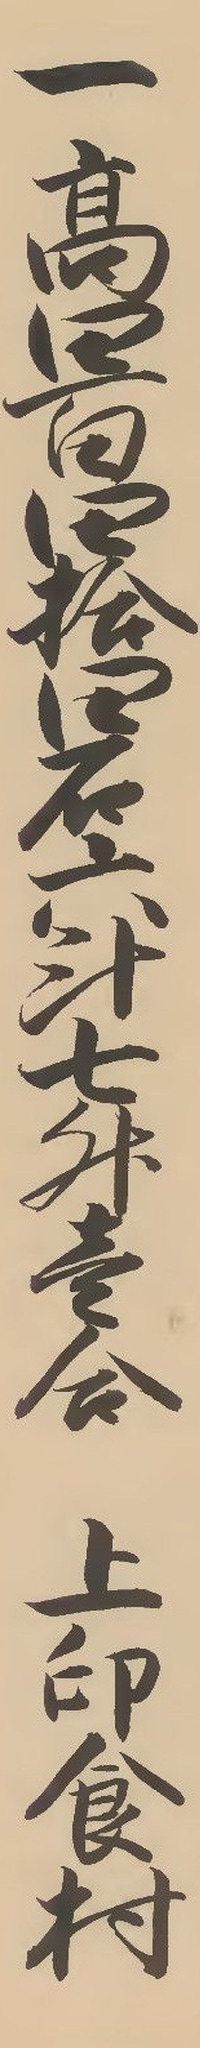一高四百四拾四石六斗七升壱合上印食村

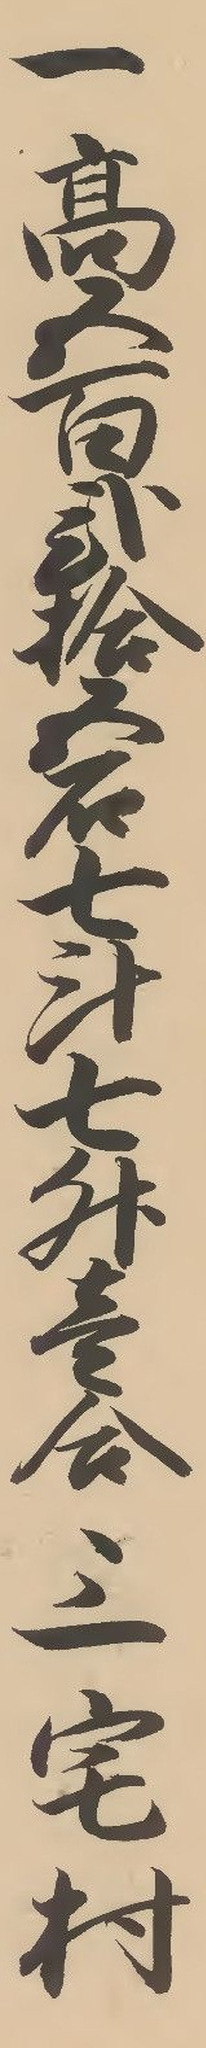一高五百弐拾五石七斗七升壱合三宅村
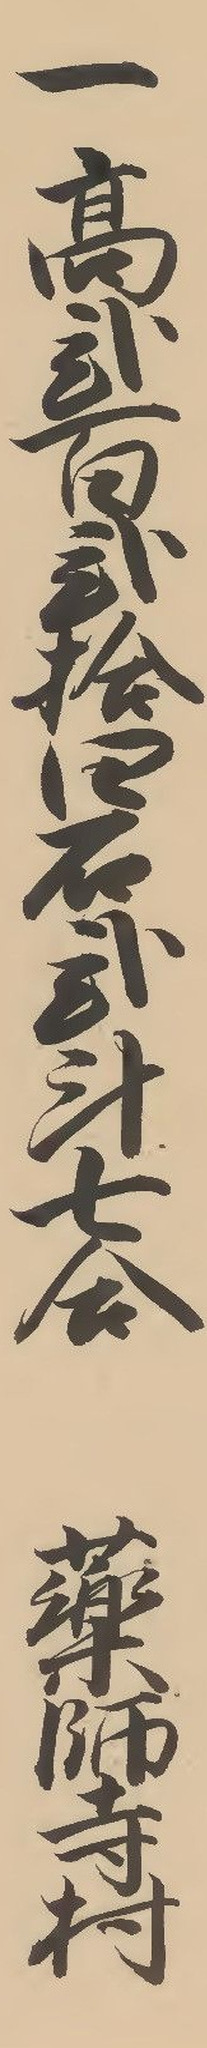一高弐百弐拾四石弐斗七合薬師寺村
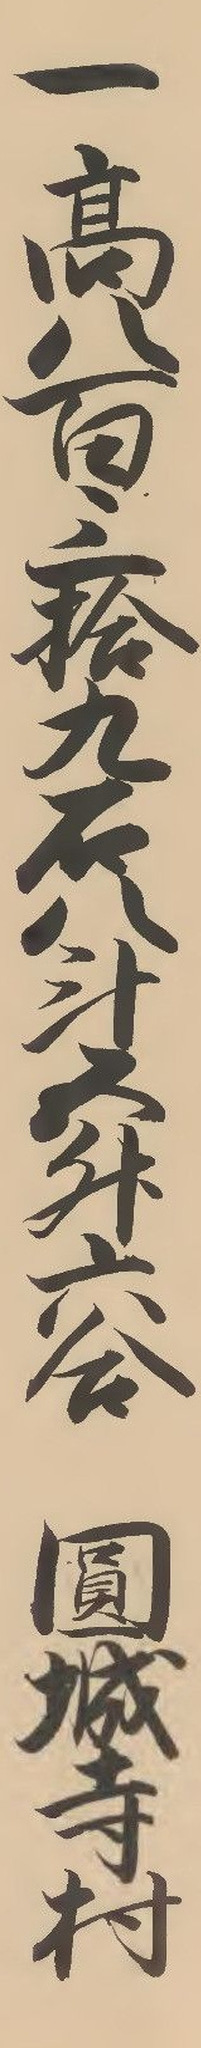一高八百三拾九石八斗五升六合円城寺村
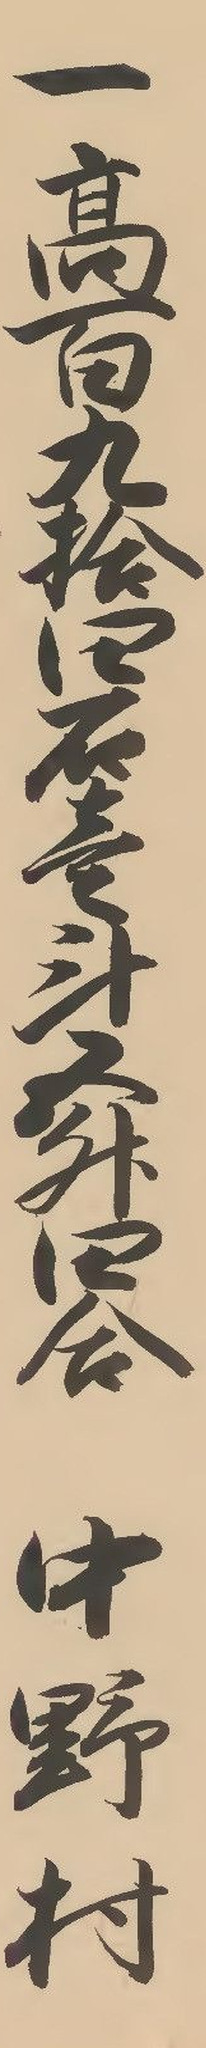一高百九拾四石壱斗五升四合中野村
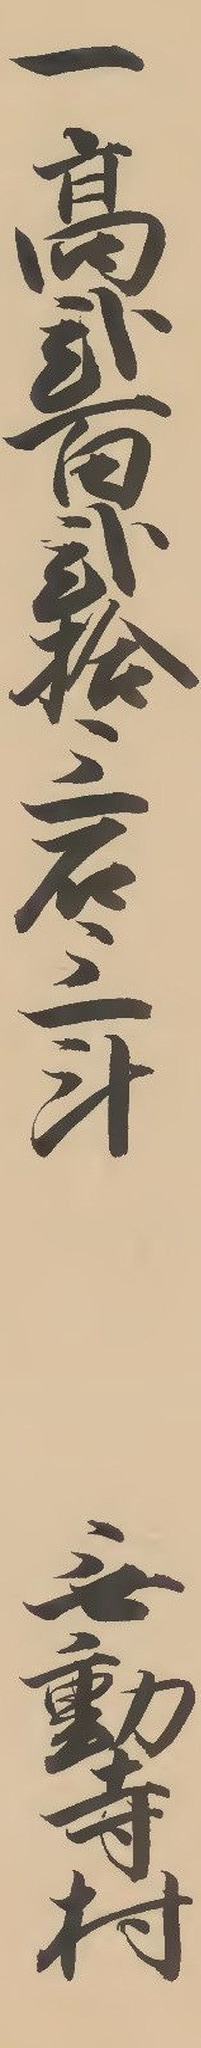一高弐百弐拾三石三斗無動寺村
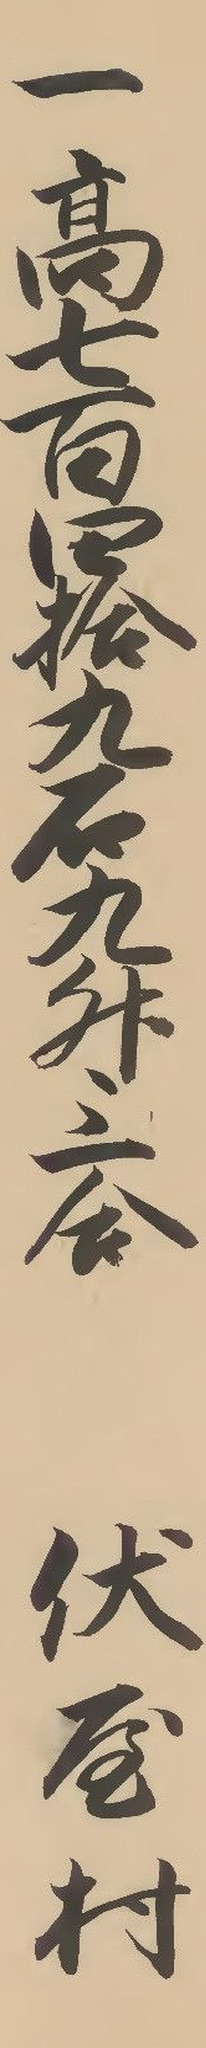一高七百四拾九石九升三合伏屋村
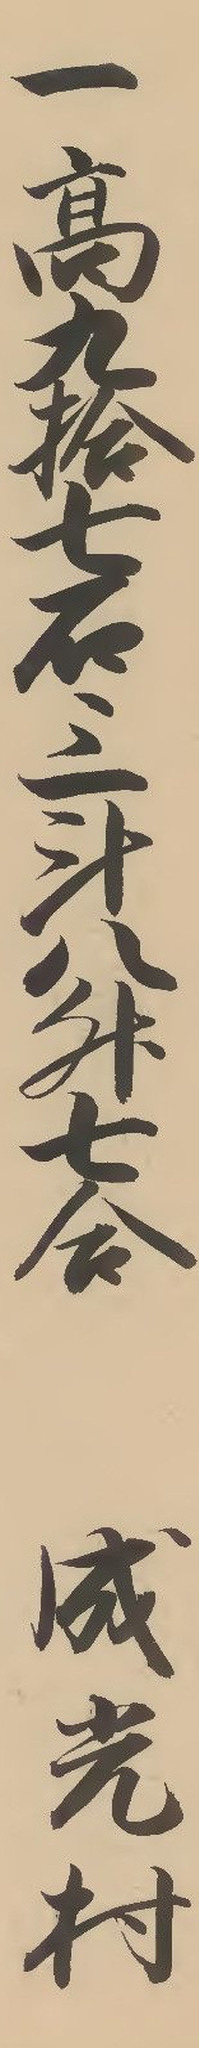一高九拾七石三斗八升七合成光村
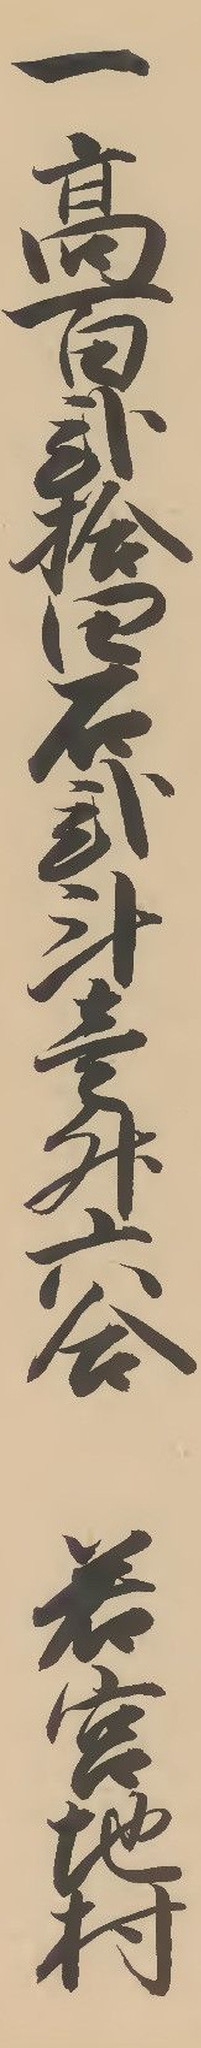一高百弐拾四石弐斗壱升六合若宮地村

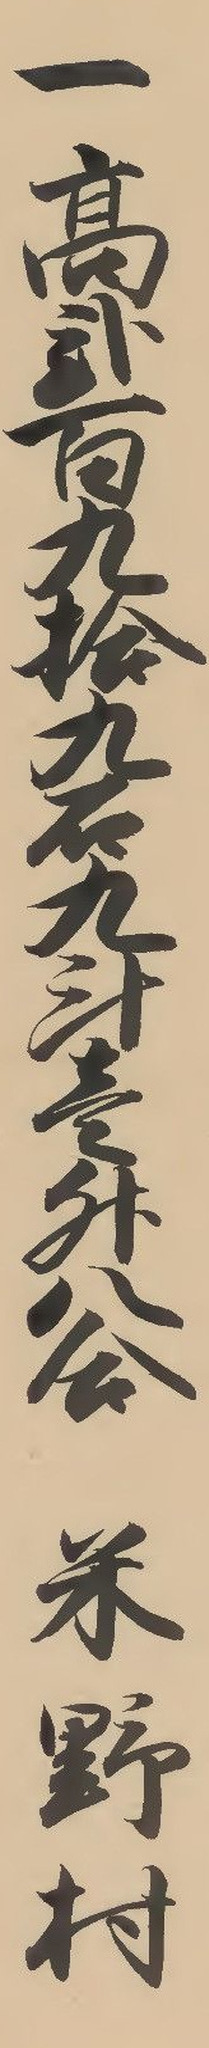一高弐百九拾九石九斗壱升八合米野村
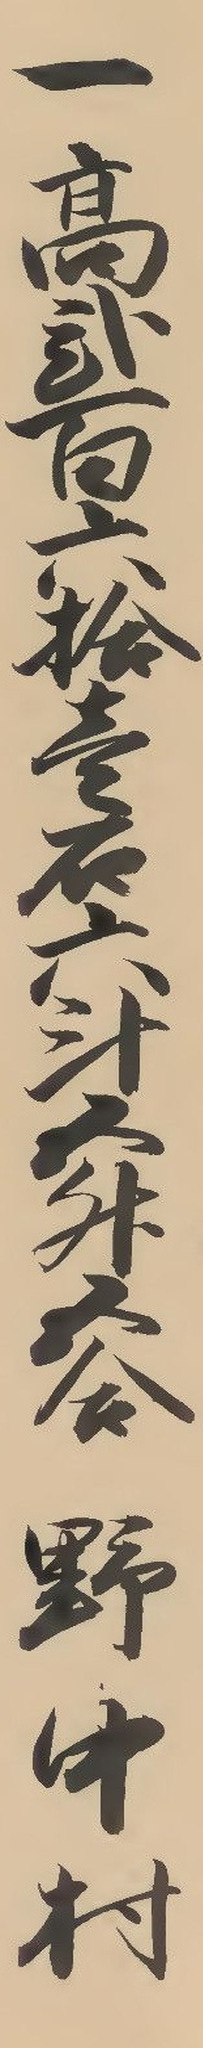一高弐百六拾壱石六斗五升五合野中村
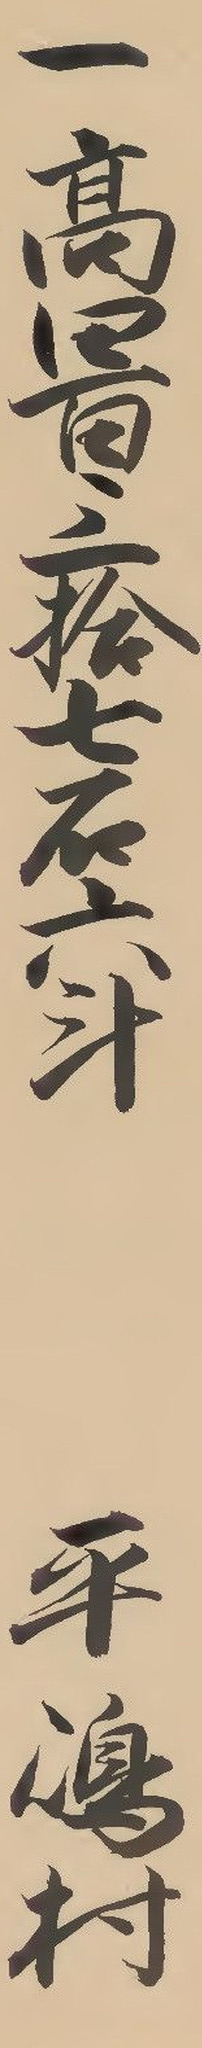一高四百三拾七石六斗平島村
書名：美濃国郷帳
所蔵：国立公文書館 National Archives of Japan
